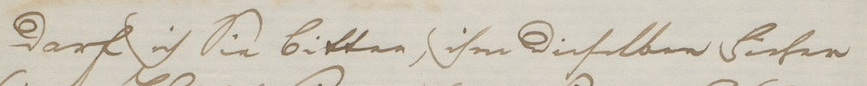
Darf ich Sie bitten, ihm dieselben hieher
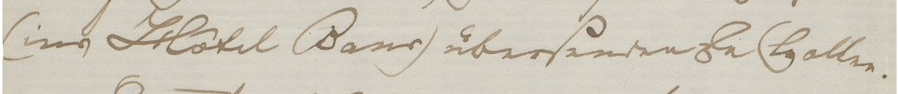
(ins Hôtel Baur) übersenden zu wollen.
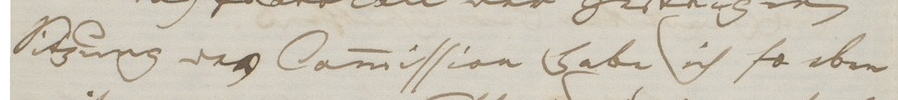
Sitzung der Commission habe ich so eben
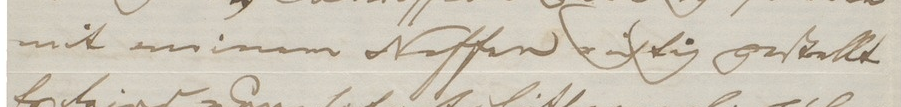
mit meinem Neffen richtig gestellt.
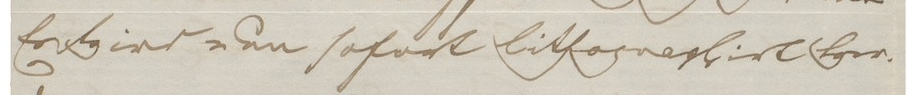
Es wird nun sofort lithographirt wer-
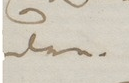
den.
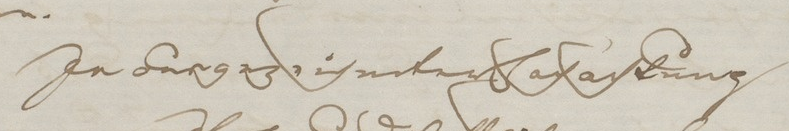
In ausgezeichneter Hochachtung
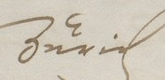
Zürich
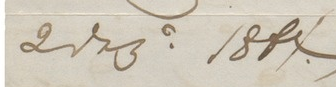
2 dezr 1864.
